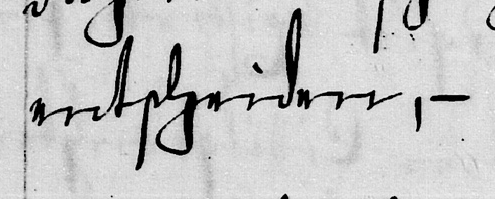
entscheiden, –
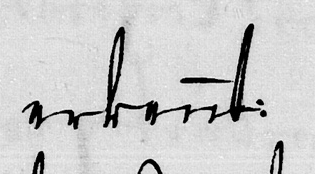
erkennt:
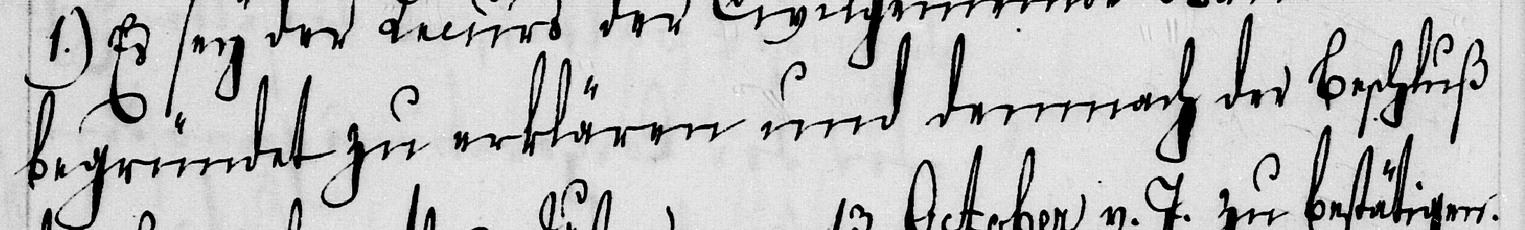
begründet zu erklären und demnach der Beschluß
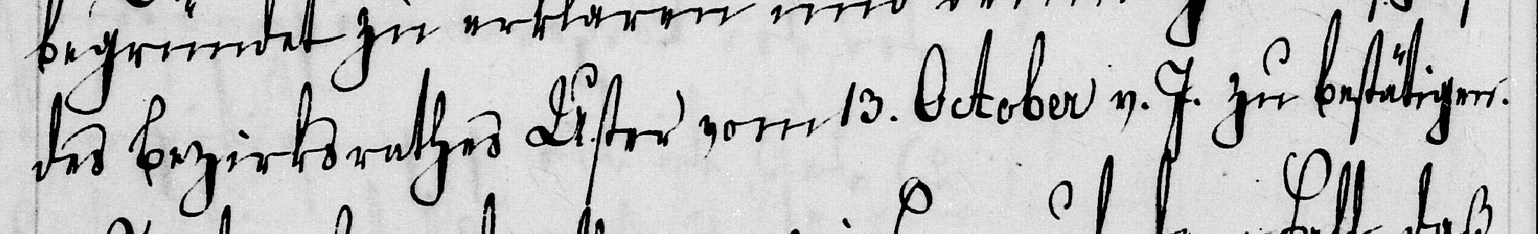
des Bezirksrathes Uster vom 13. October v. J. zu bestätigen.
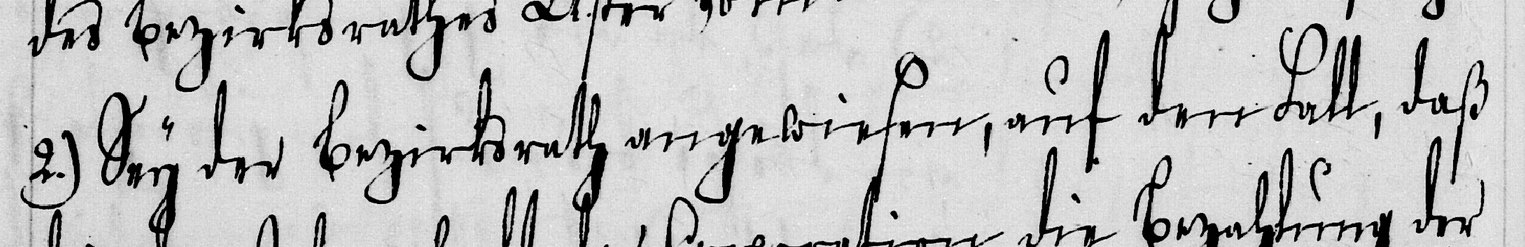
2.) Sey der Bezirksrath angewiesen, auf den Fall, daß
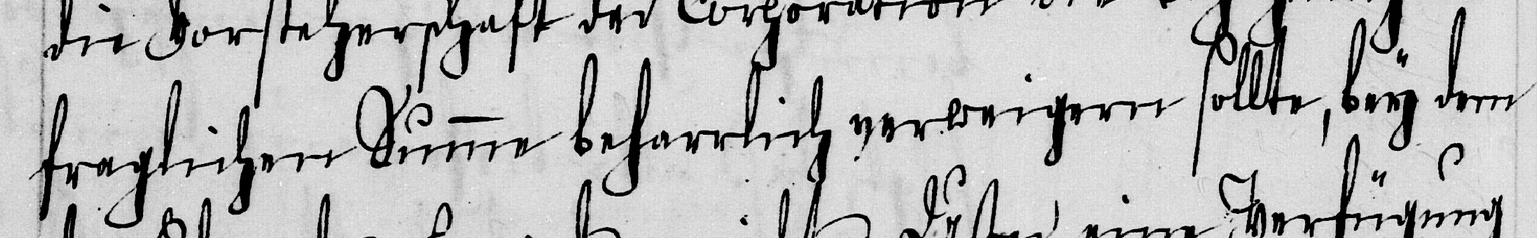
fraglichen Summe beharrlich verweigern sollte, bey dem
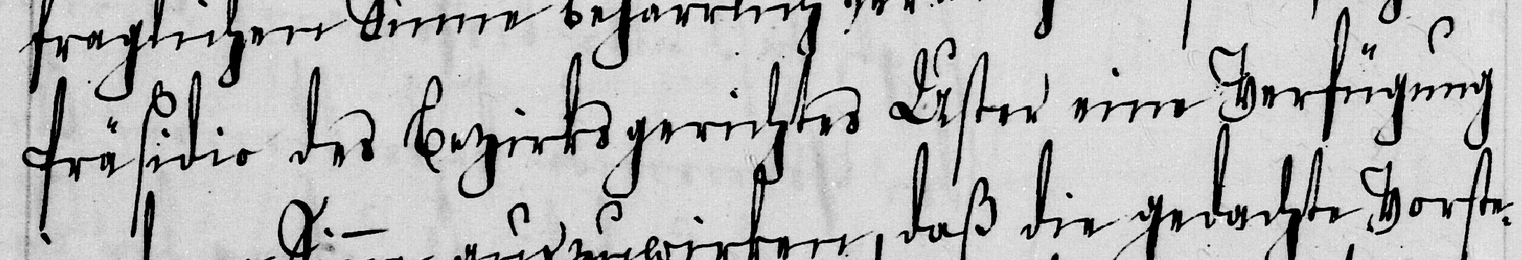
Präsidio des Bezirksgerichtes Uster eine Verfügung
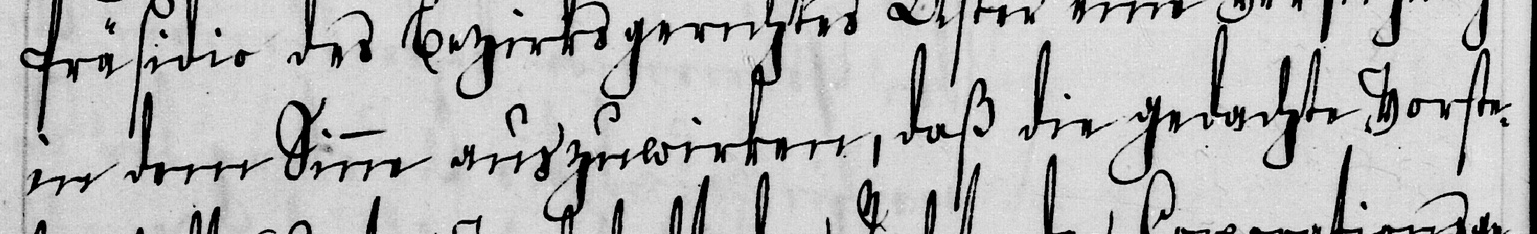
in dem Sinne auszuwirken, daß die gedachte Vorst¬
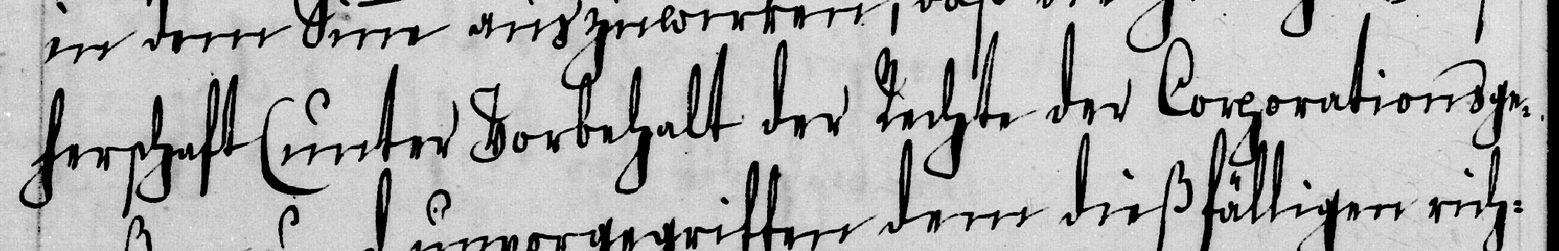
eherschaft (unter Vorbehalt der Rechte der Corporationsge¬
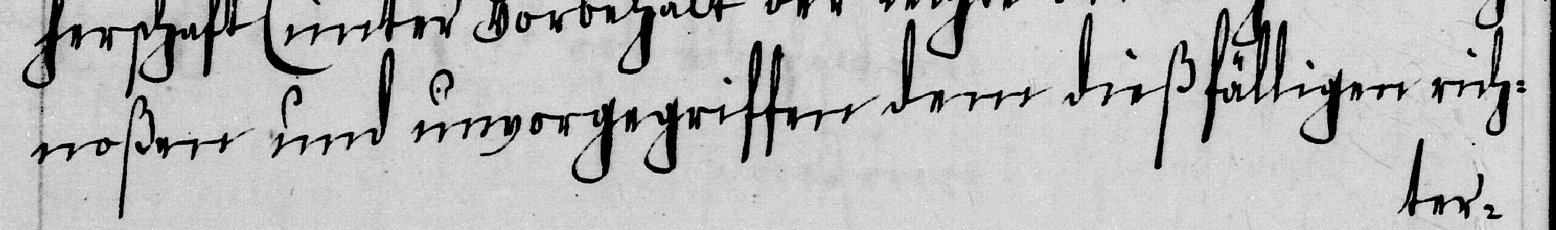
noßen und unvorgegriffen dem dießfälligen rich-
